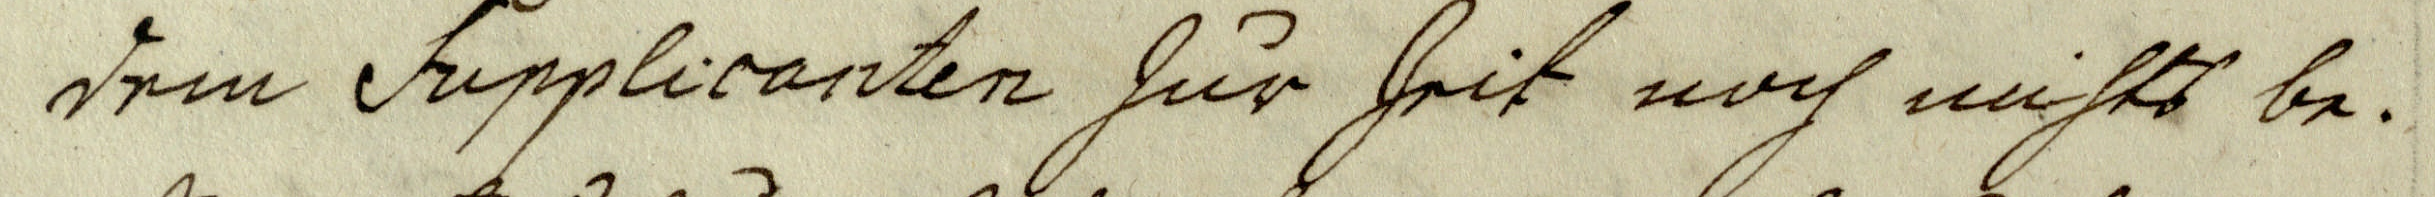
dem Supplicanten zur Zeit noch nichts be¬
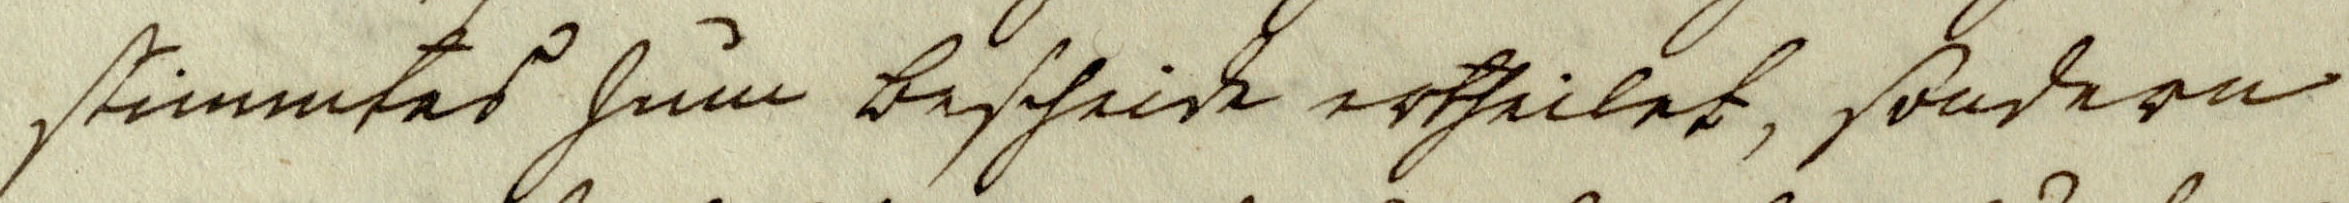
stimmtes zum Bescheide ertheilet, sondern
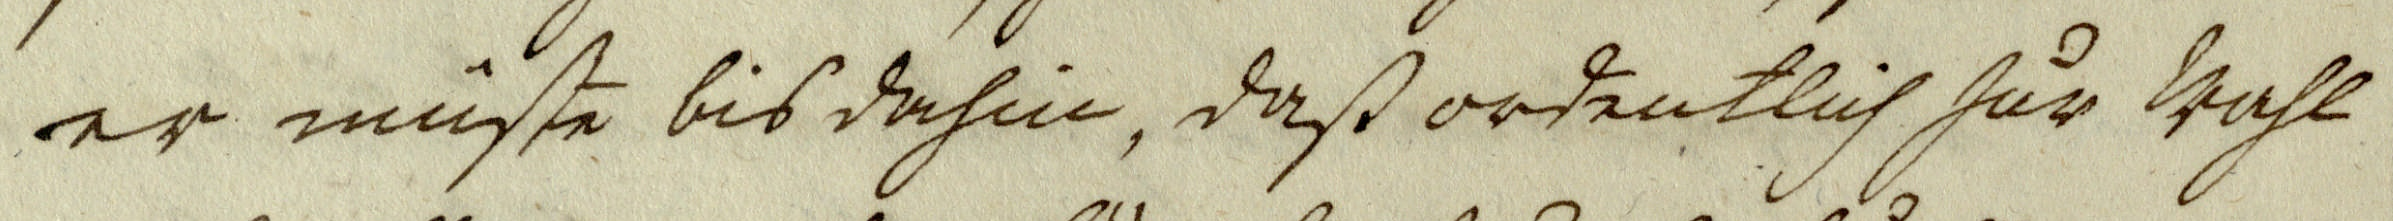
er müsste bis dahin, daß ordentlich zur Wahl
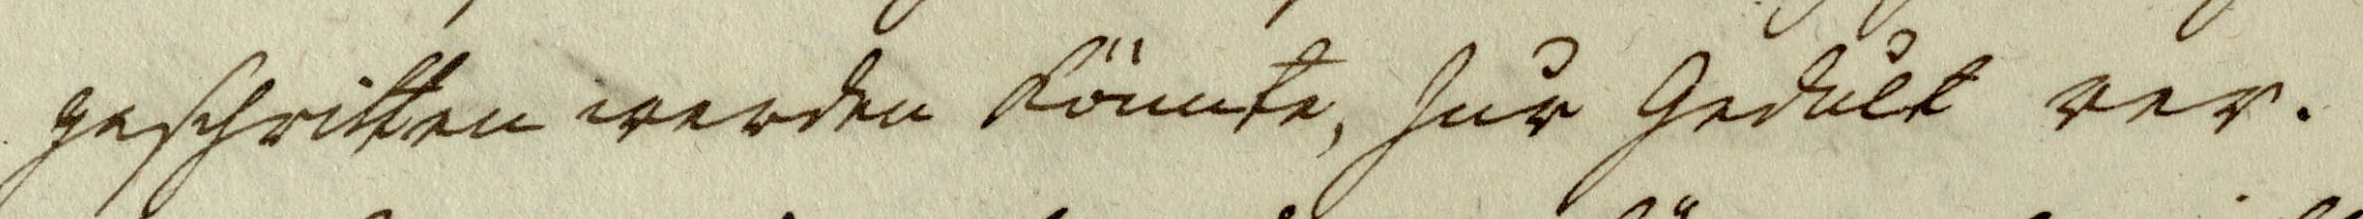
geschritten werden könnte, zur Gedult ver¬
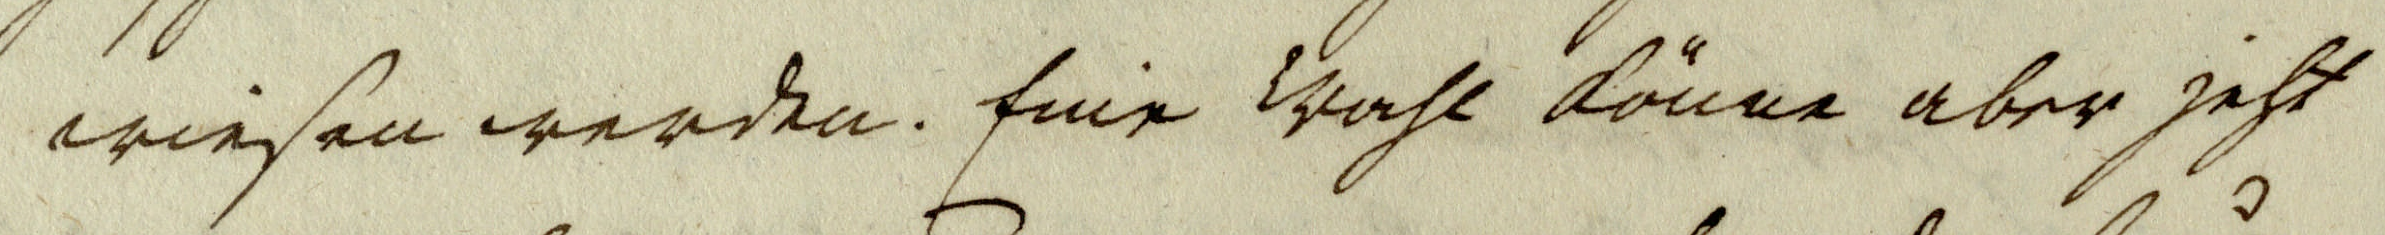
wiesen werden. Eine Wahl könne aber jetzt
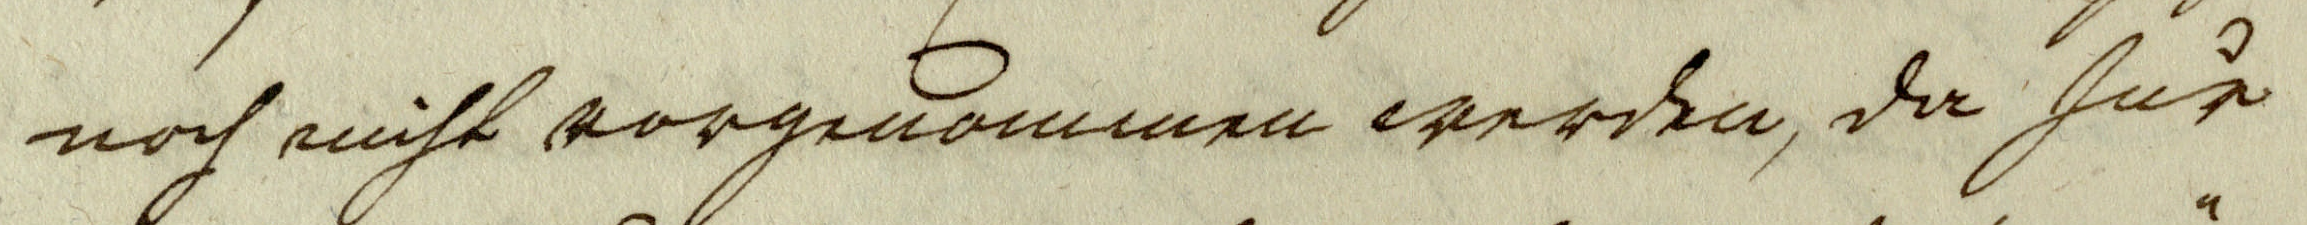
noch nicht vorgenommen werden, da zur
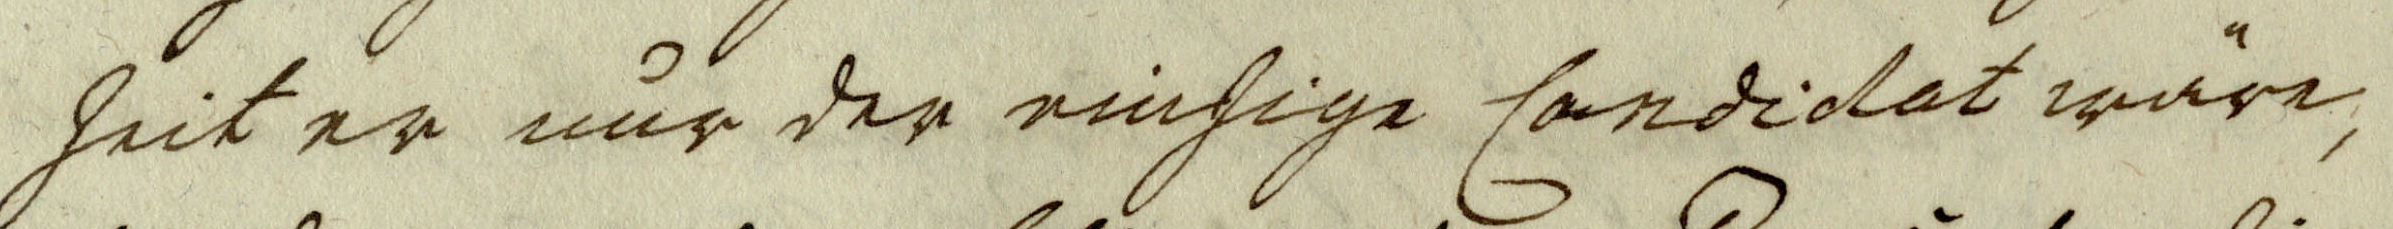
Zeit er nur der einzige Candidat wäre,
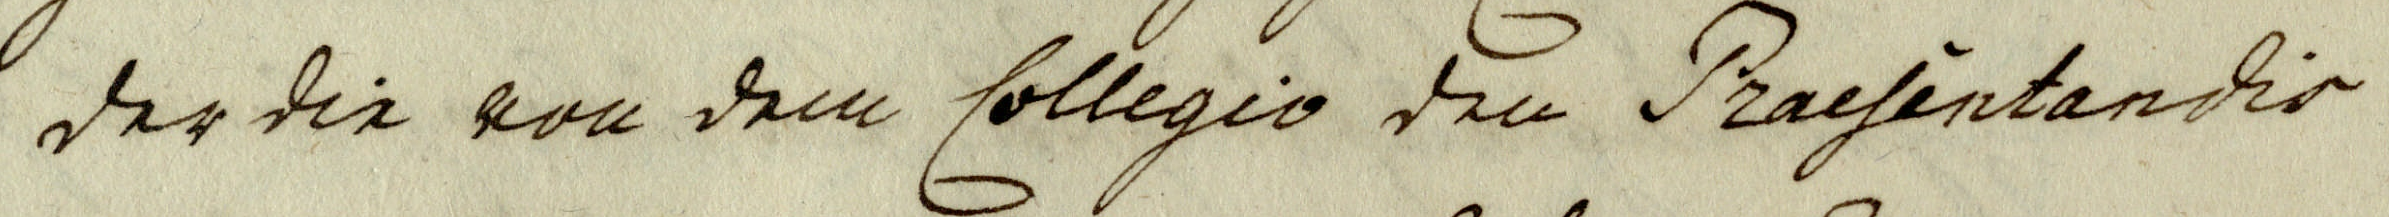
der die von dem Collegio den Praesentandis
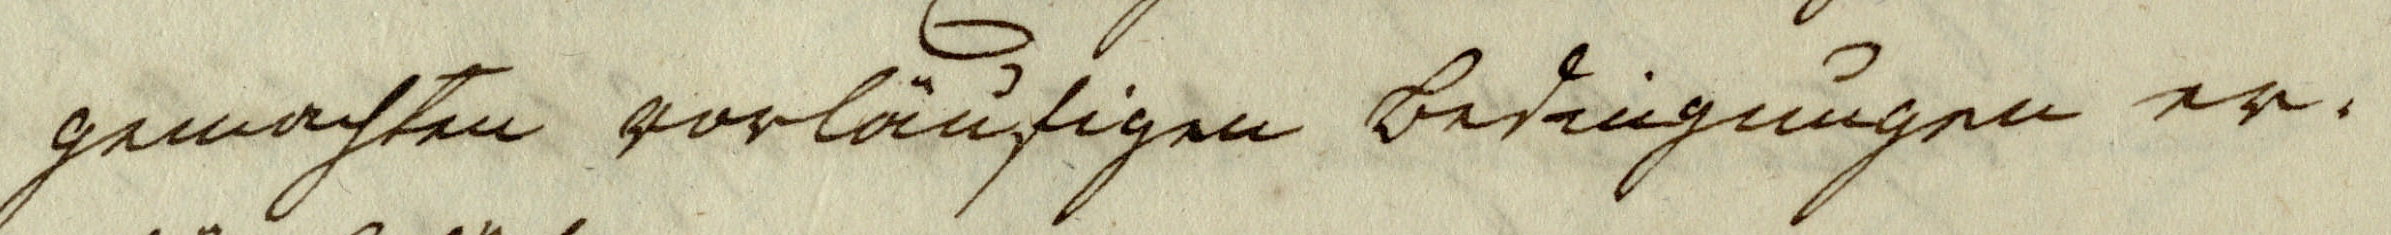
gemachten vorläufigen Bedingungen er¬
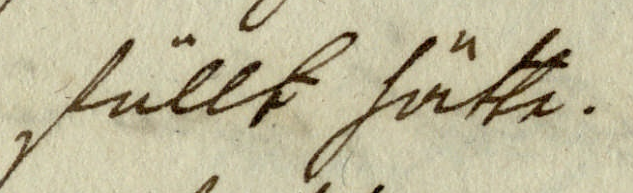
füllt hätte.
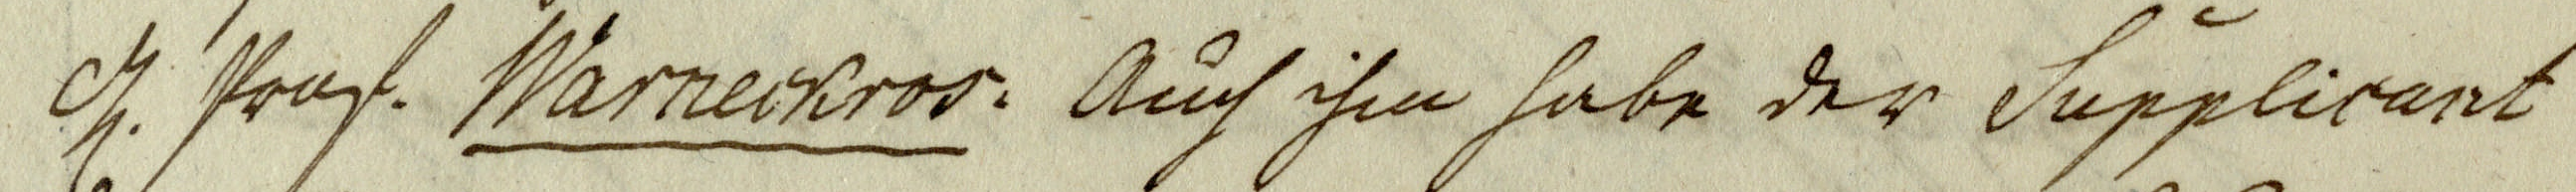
dh. Prof. Warneckros. Auch ihm habe der Supplicant
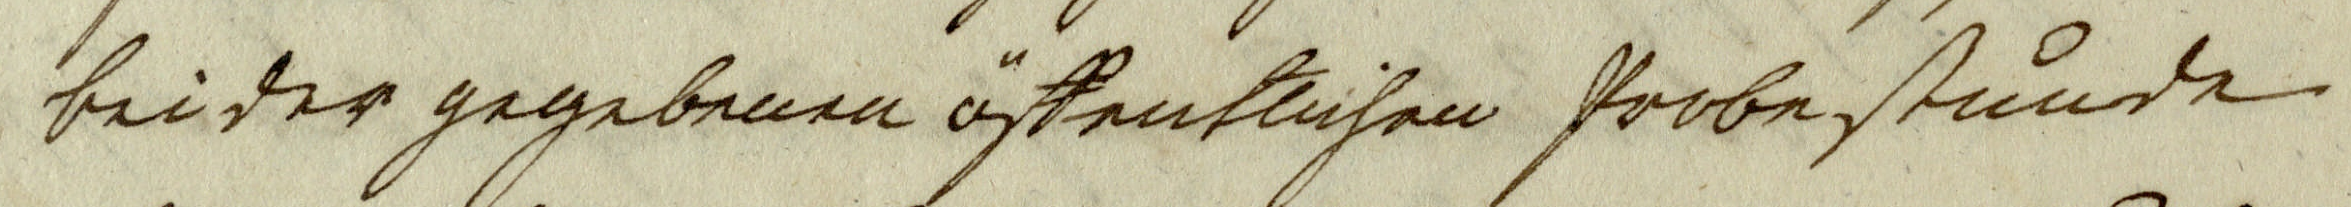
bei der gegebenen öffentlichen Probestunde
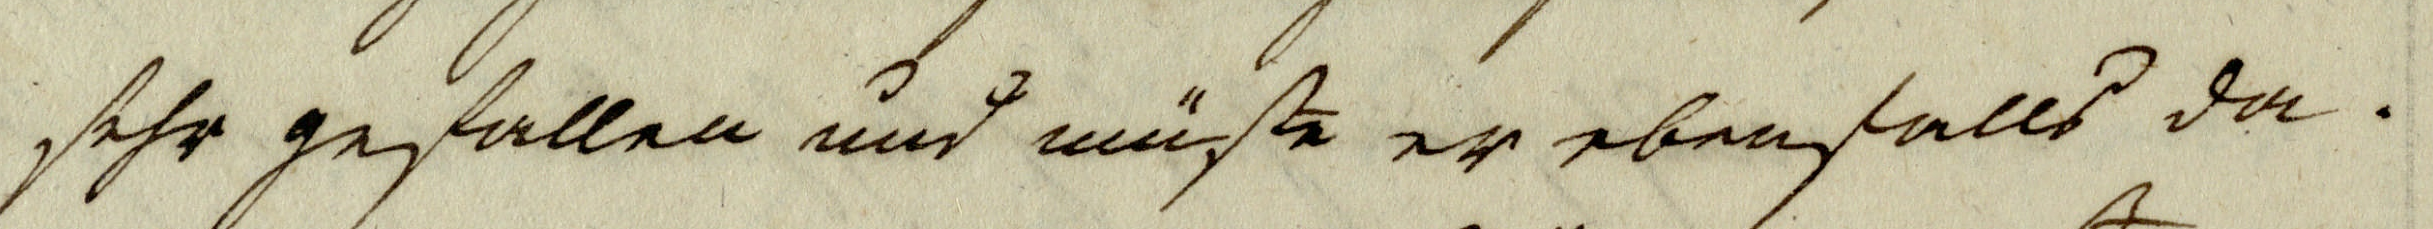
sehr gefallen und müsste er ebenfalls da¬
